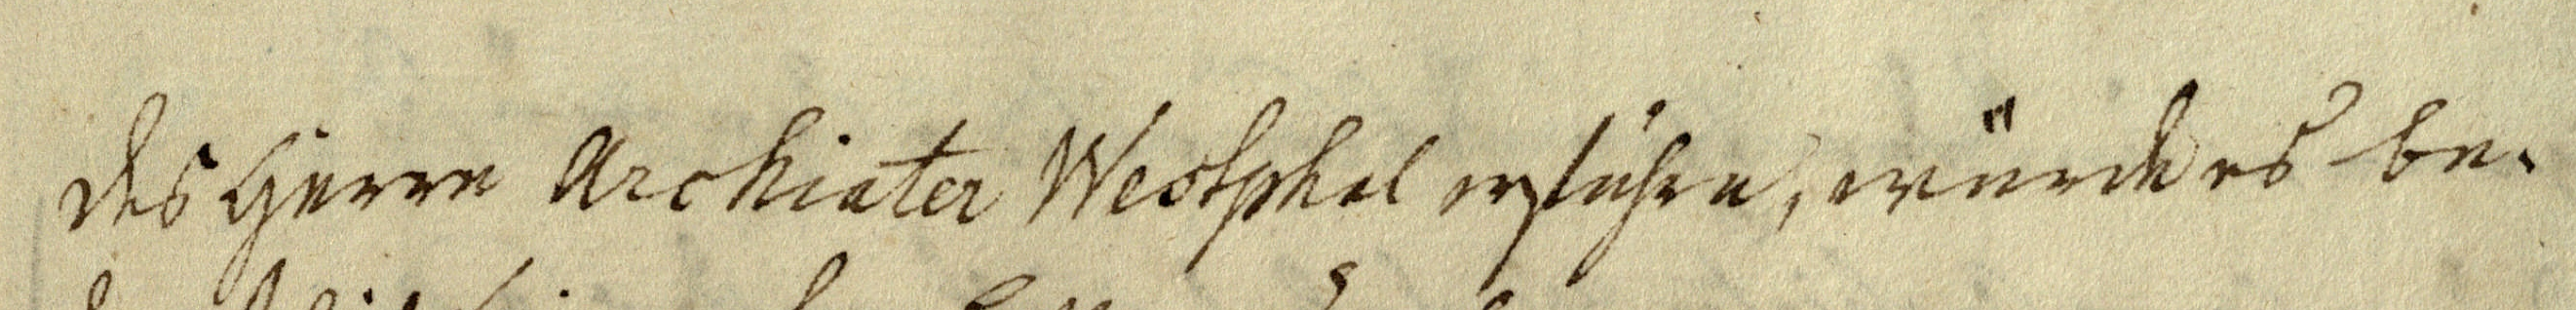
des Herrn Archiater Westphal erführe, würde es be¬
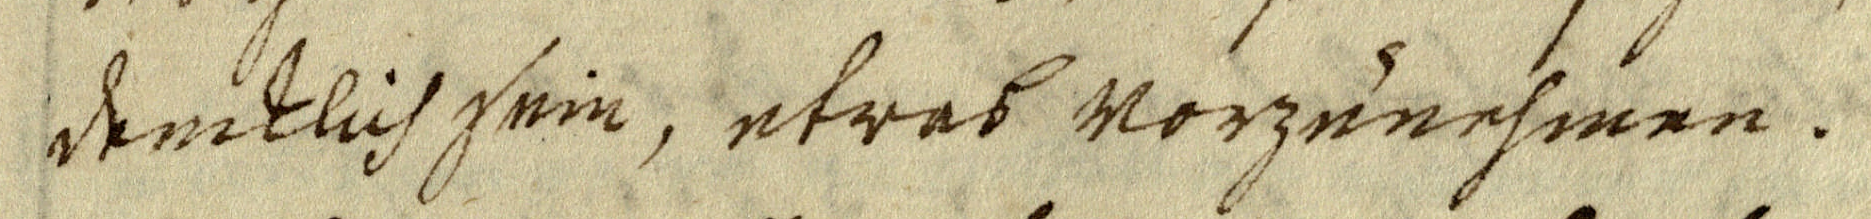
dencklich sein, etwas vorzunehmen.
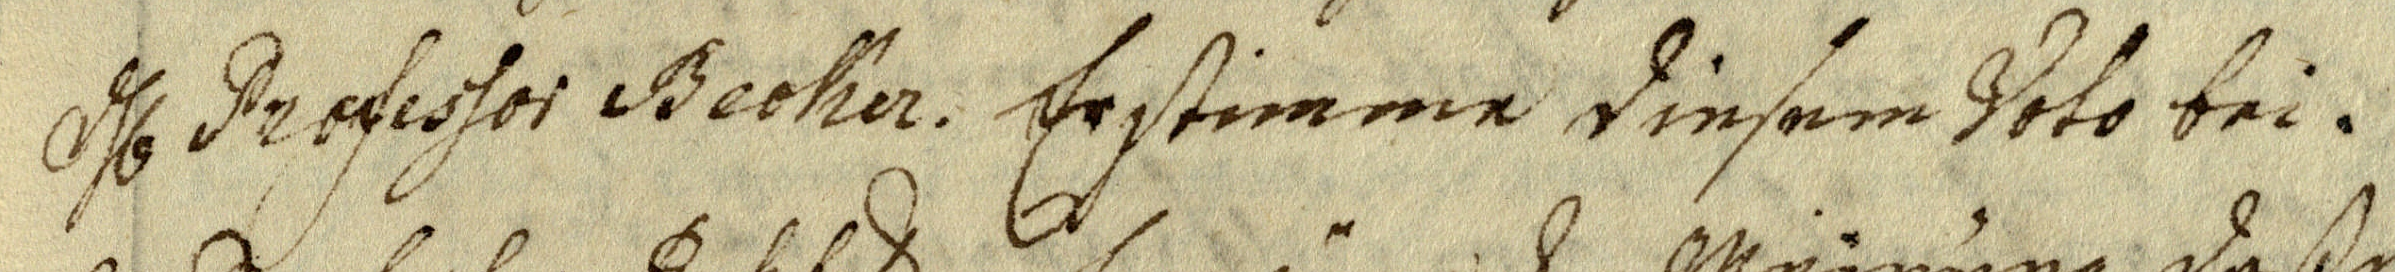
dh Professor Becker. Er stimme diesem Voto bei.
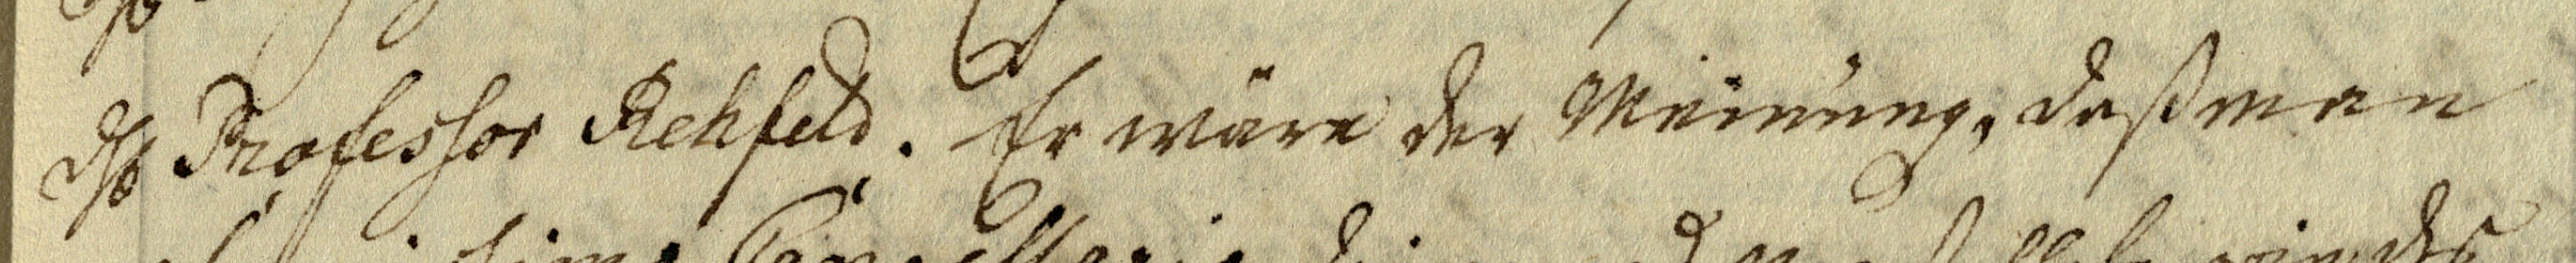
dh Professor Rehfeld. Er wäre der Meinung, daß man
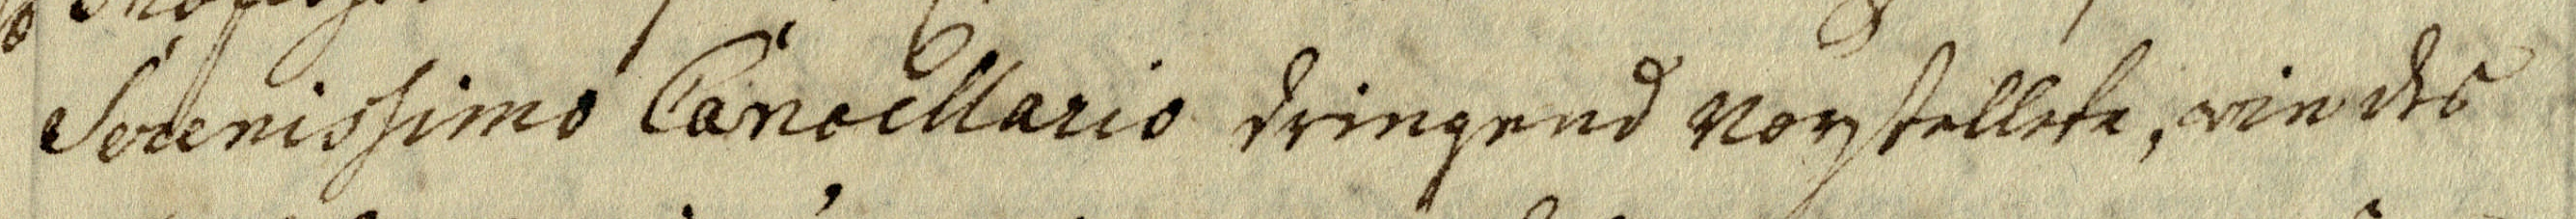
Seremissimo Cancellario dringend vorstellte, wie des
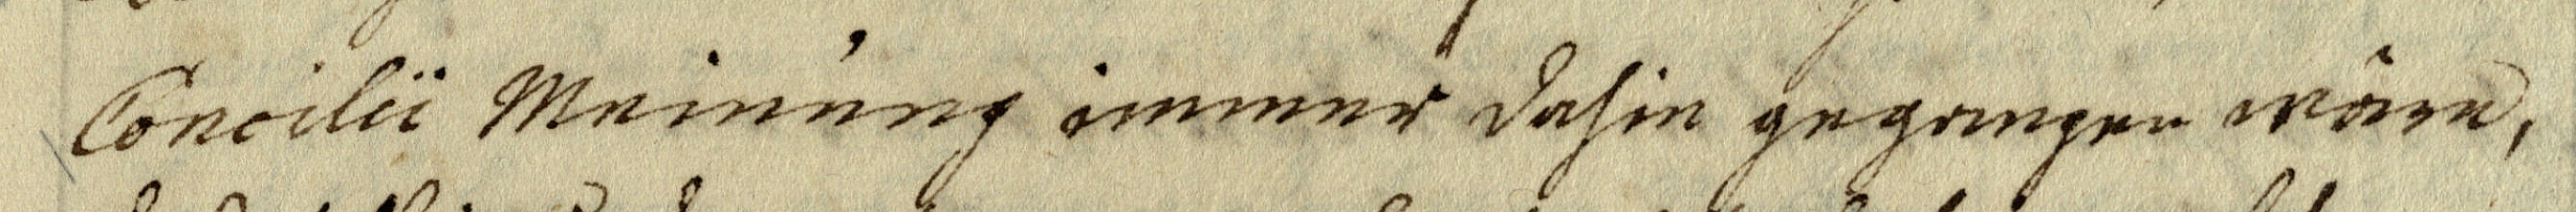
Concilii Meinung immer dahin gegangen wäre,
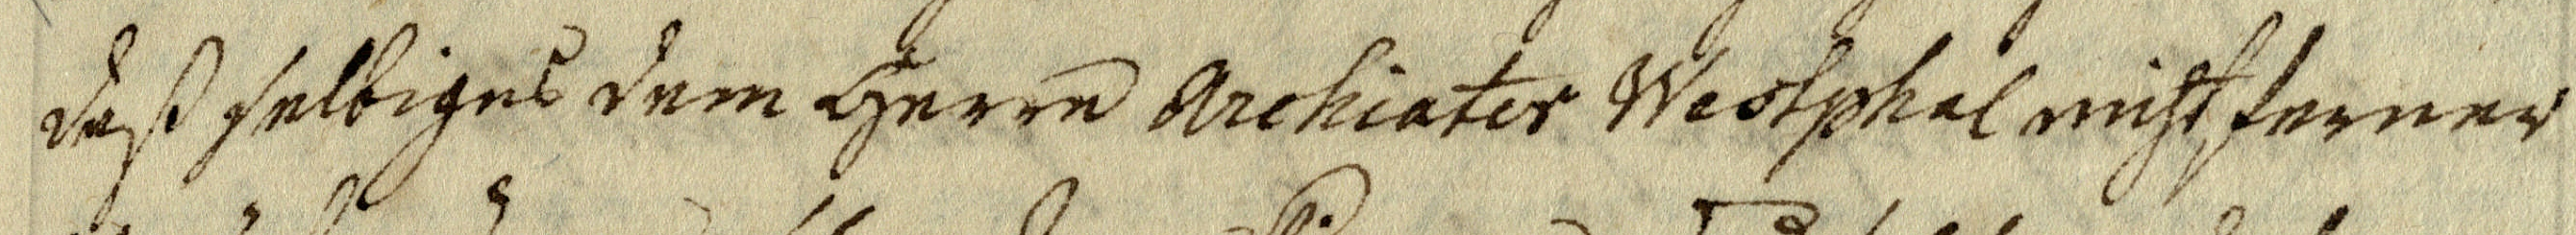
daß selbiges dem Herrn Archiater Westphal nicht ferner
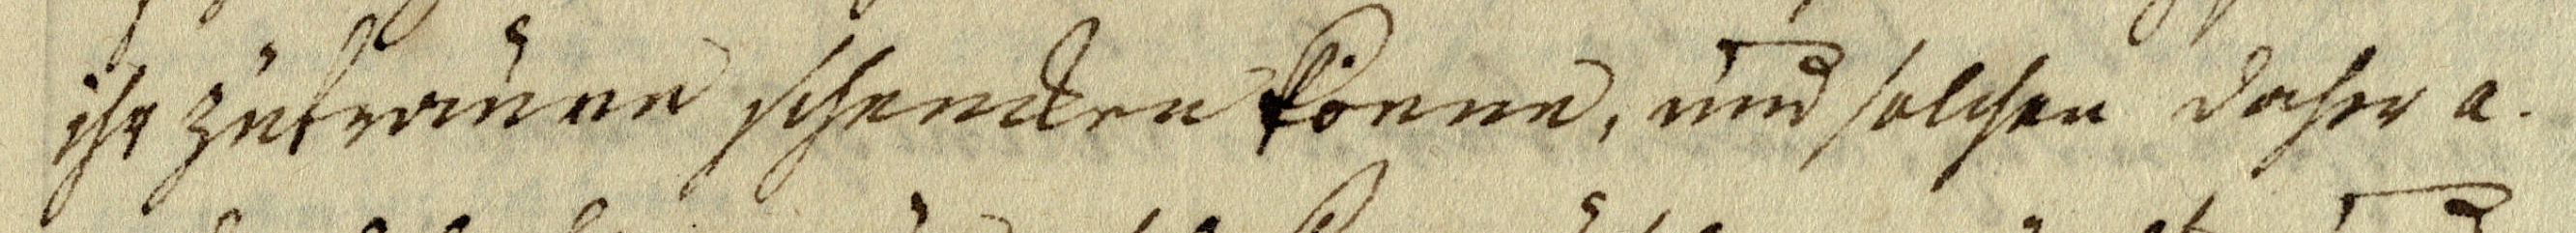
ihr Zutrauen schencken könne, und solchen daher a.
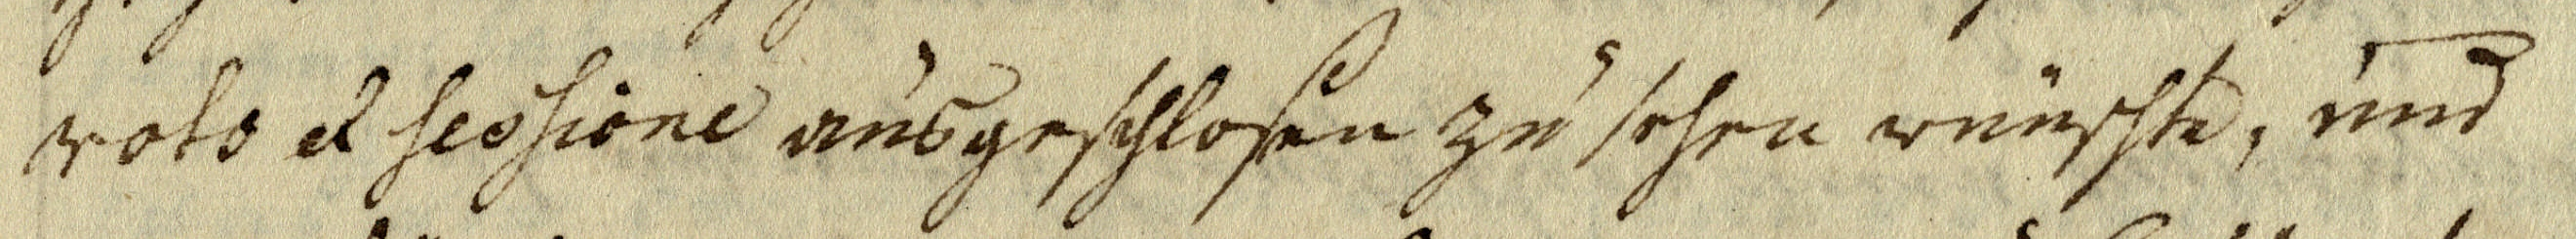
voto et sessione ausgeschlossen zu sehen wünschte, und
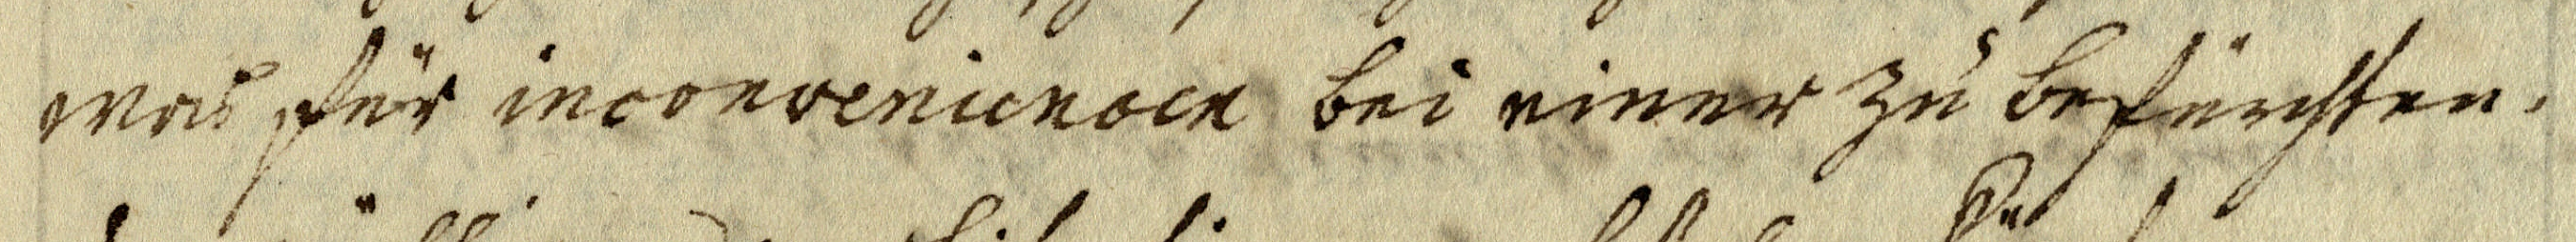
was für inconveniencen bei einer zu befürchten¬
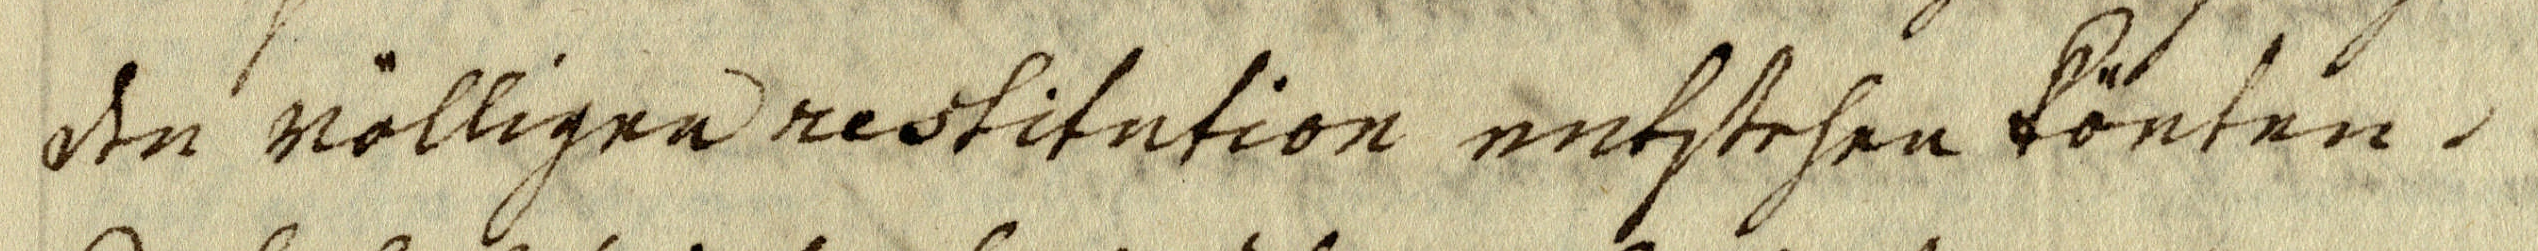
den völligen restitution entstehen könten.
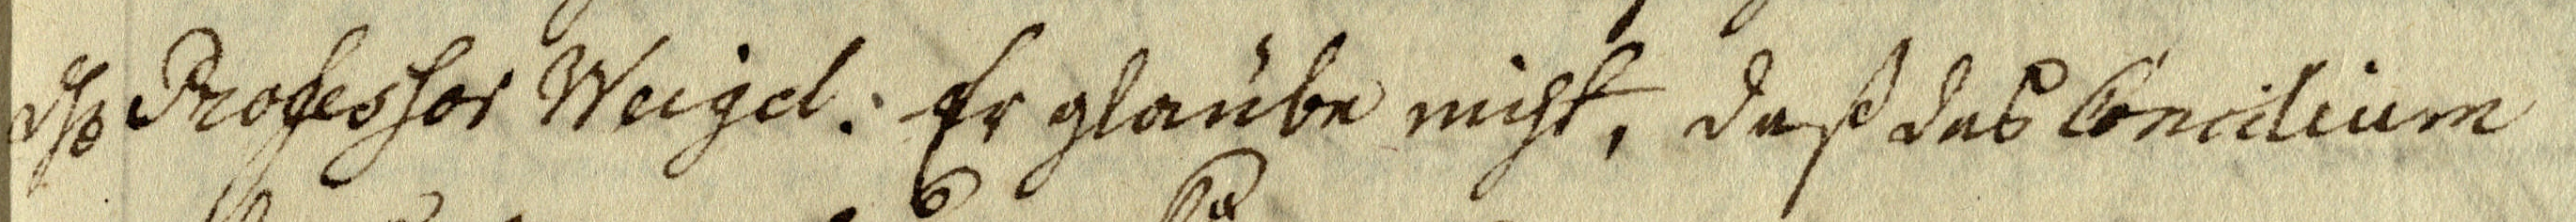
dh Professor Weigel. Er glaube nicht, daß das Concilium
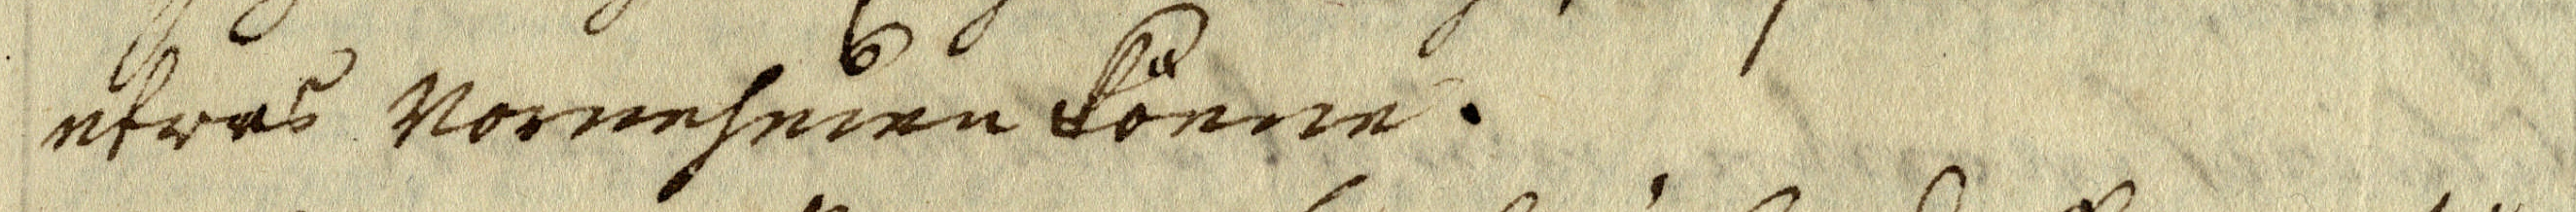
etwas vornehmen könne.
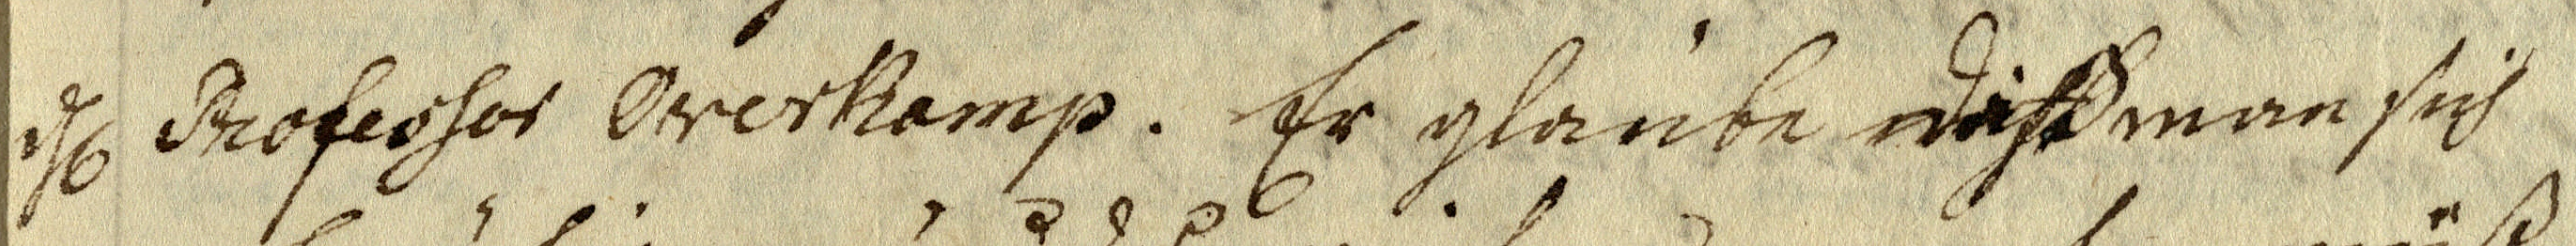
dh Professor Overkamp. Er glaube daß man sich
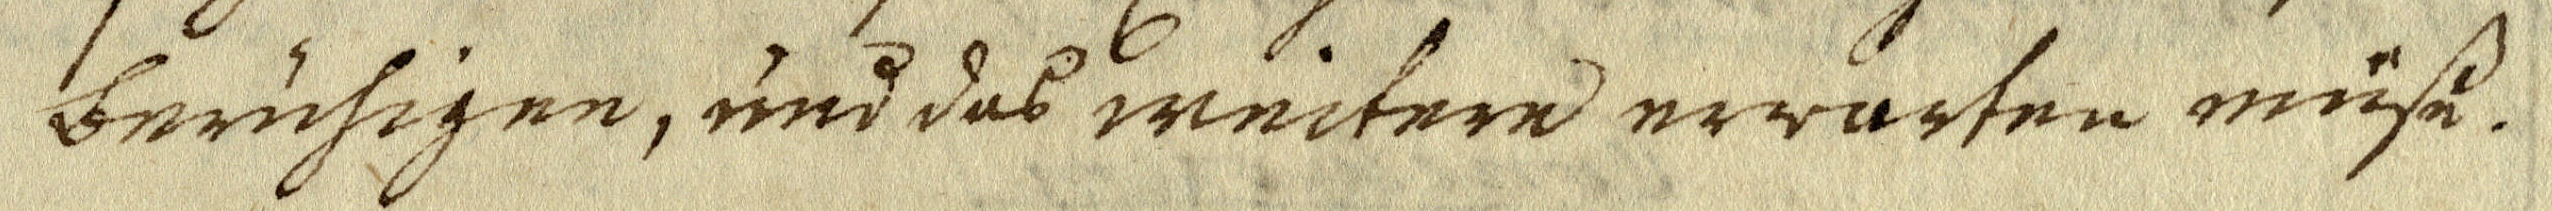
beruhigen, und das weitere erwarten müße.
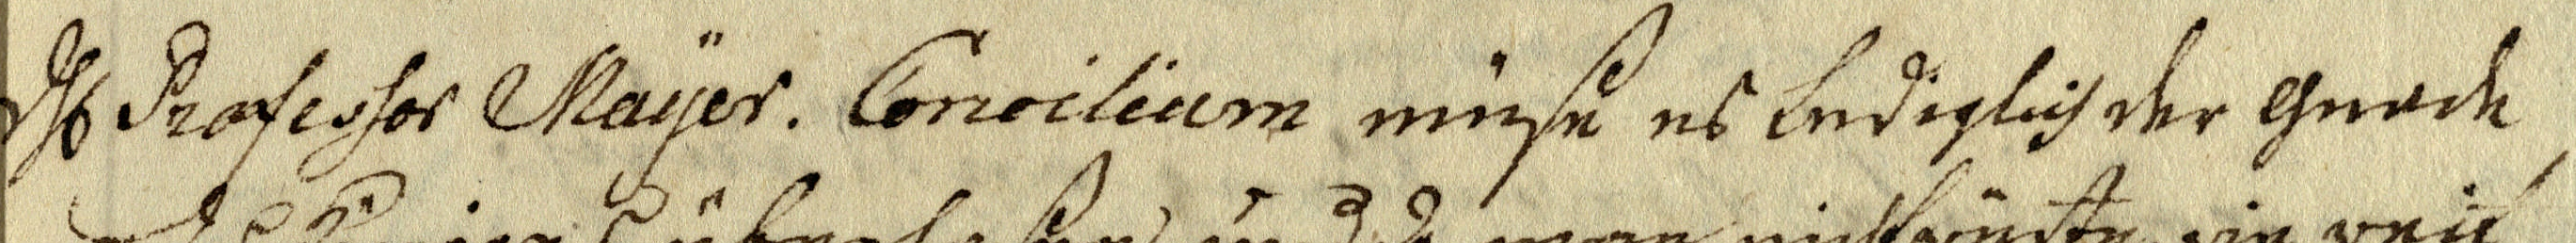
dh Professor Maÿer. Concilium müße es lediglich der Gnade
